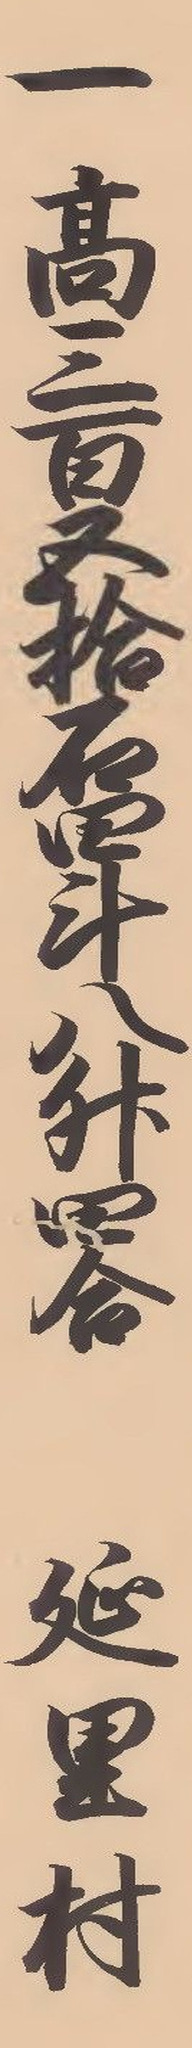一高三百五拾石四斗八升四合延里村
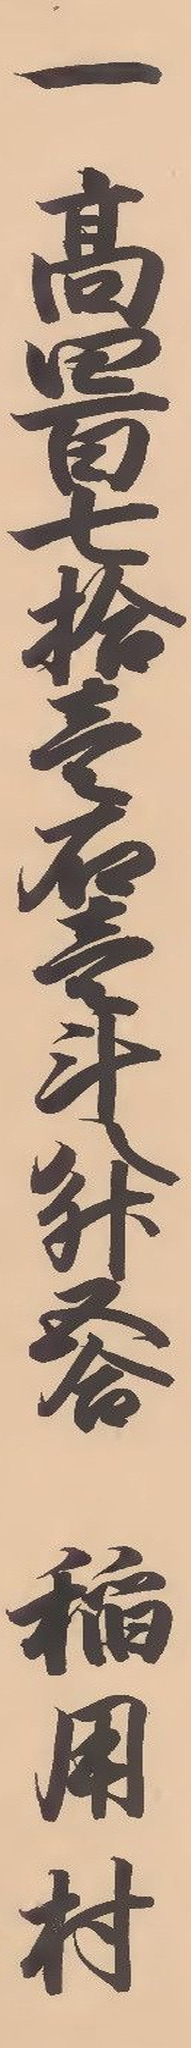一高四百七拾壱石壱斗八升六合稲用村

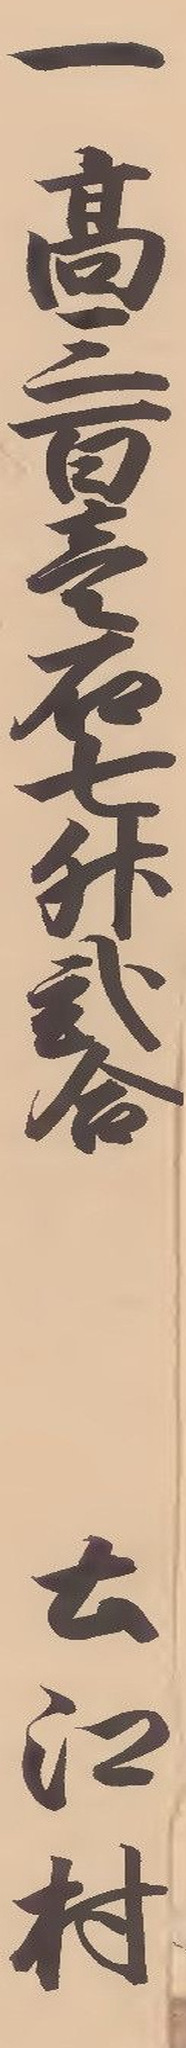一高三百壱石七升弍合土江村
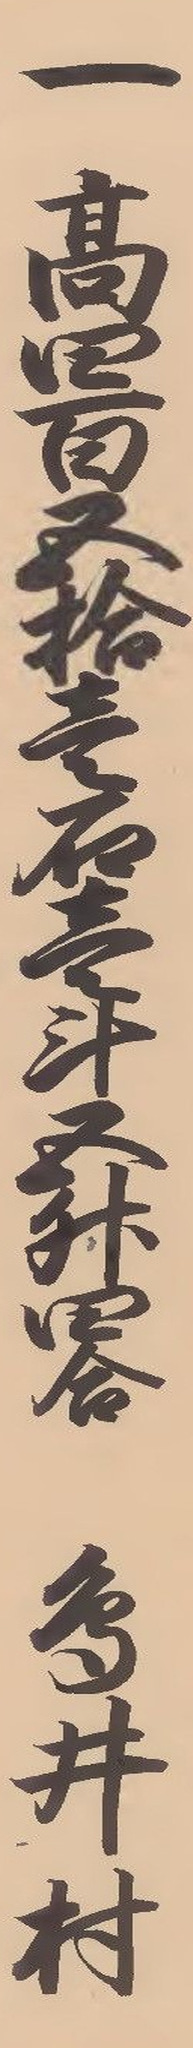一高四百五拾壱石壱斗五升四合鳥井村
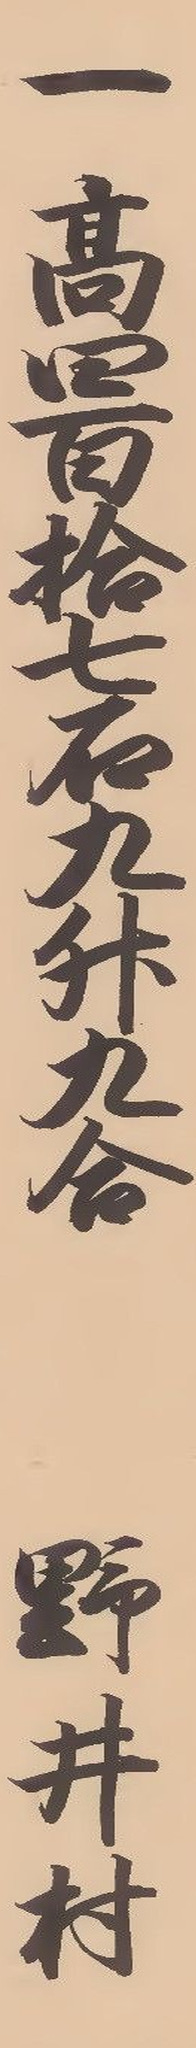一高四百拾七石九升九合野井村
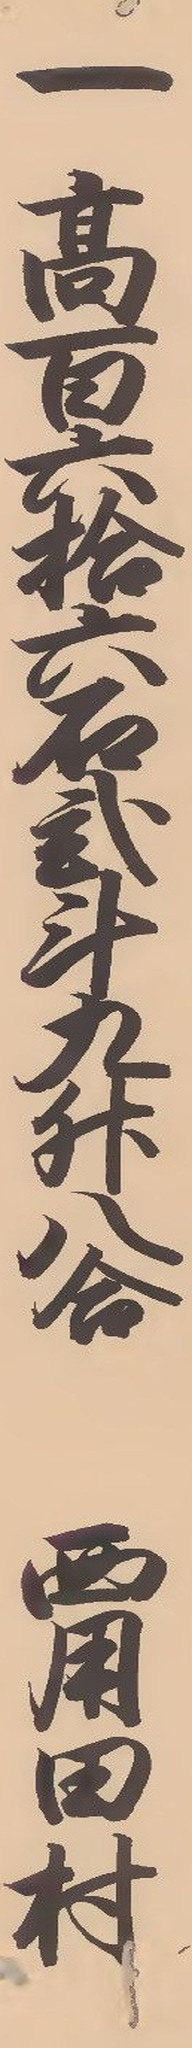一高百六拾六石弐斗九升八合西用田村
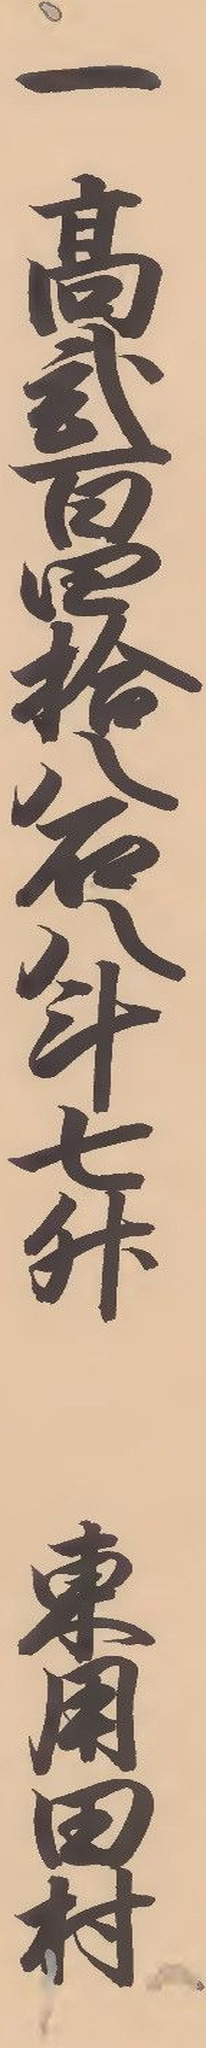一高弐百四拾八石八斗七升東用田村
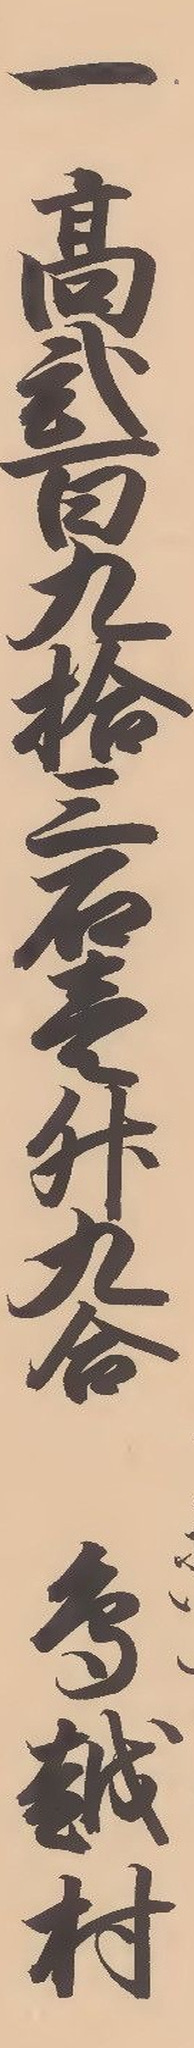一高弐百九拾三石壱升九合鳥越村
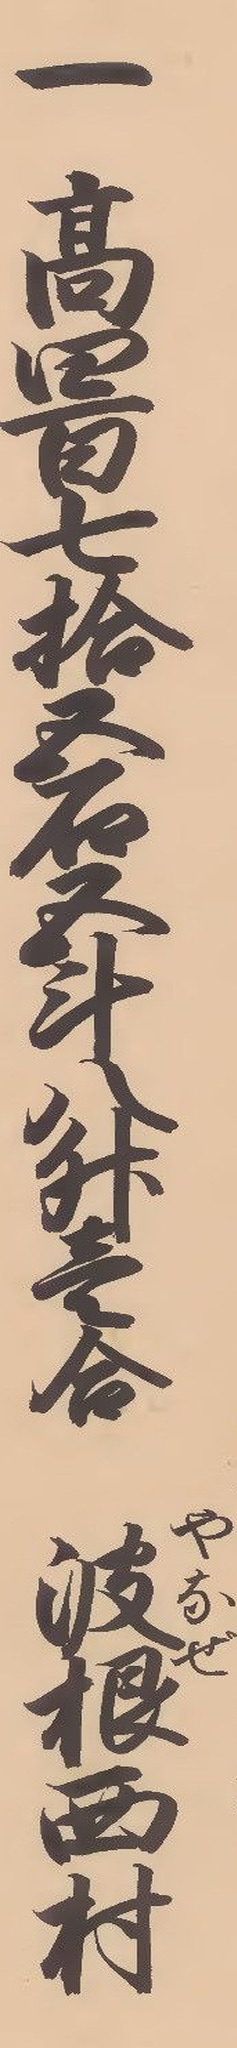一高四百七拾五石五斗八升壱合波根西村
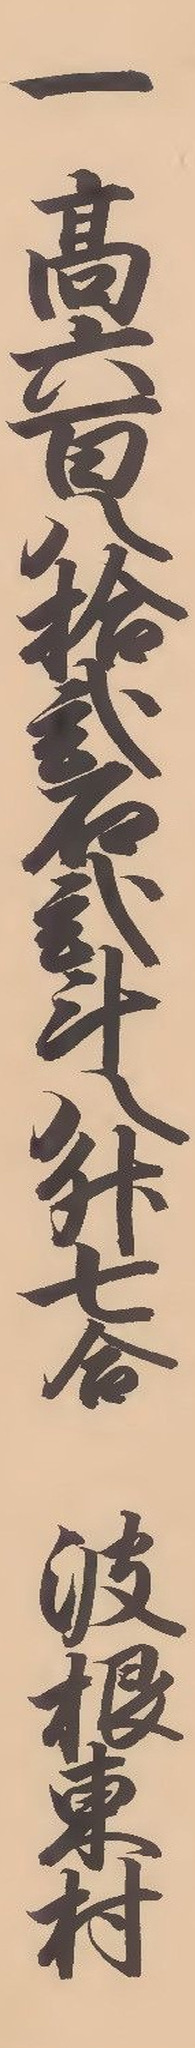一高六百八拾弐石弐斗八升七合波根東村

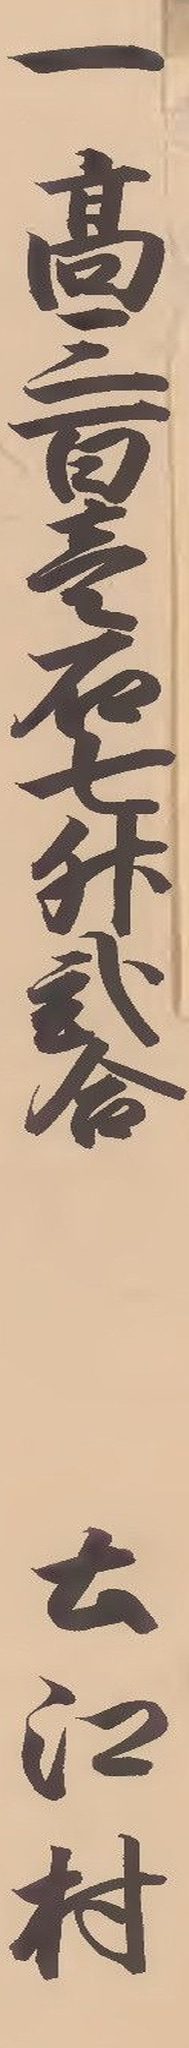一高三百壱石七升弍合土江村
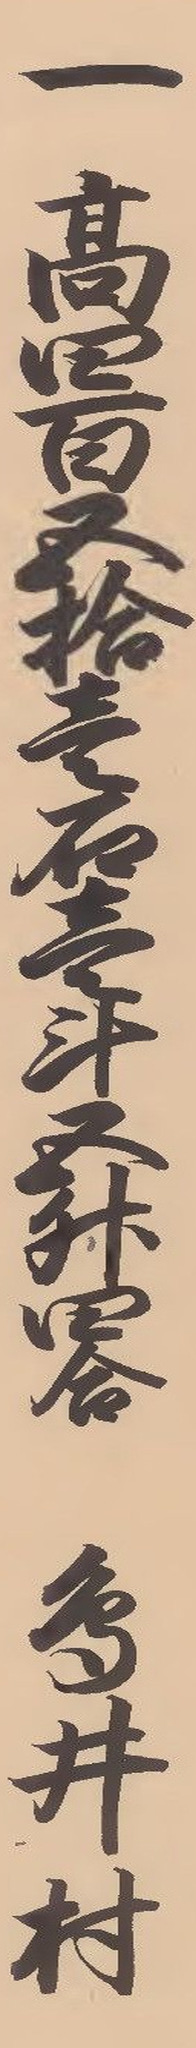一高四百五拾壱石壱斗五升四合鳥井村
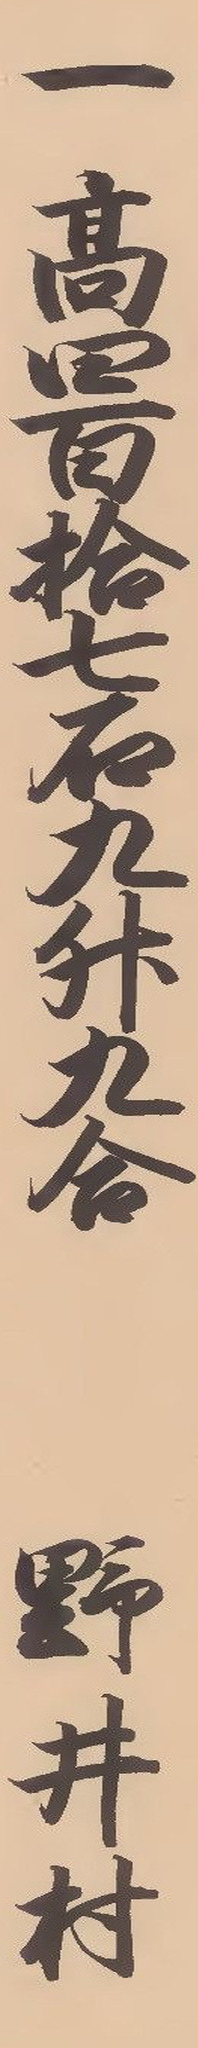一高四百拾七石九升九合野井村
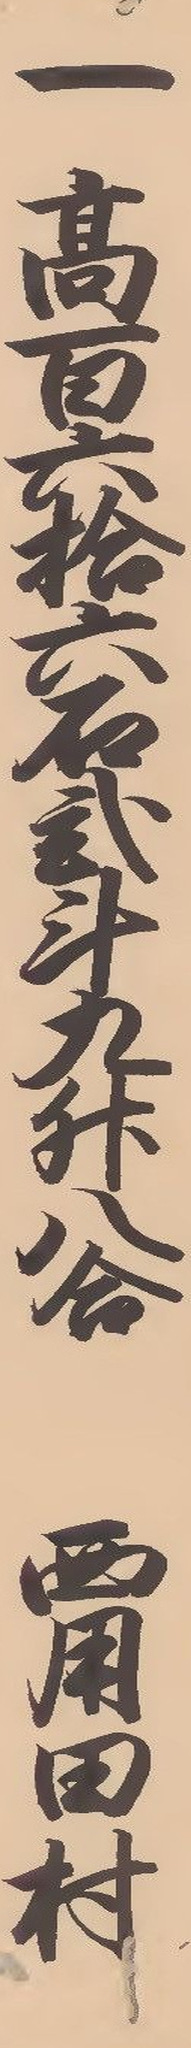一高百六拾六石弐斗九升八合西用田村
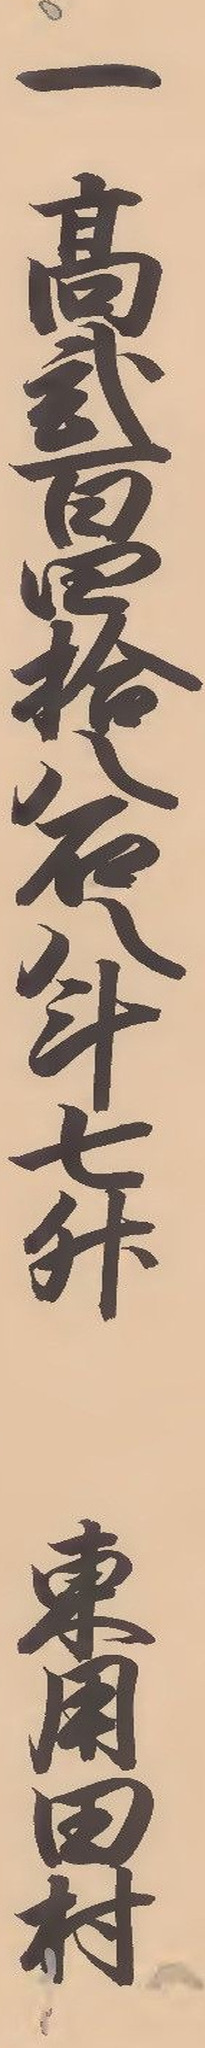一高弐百四拾八石八斗七升東用田村
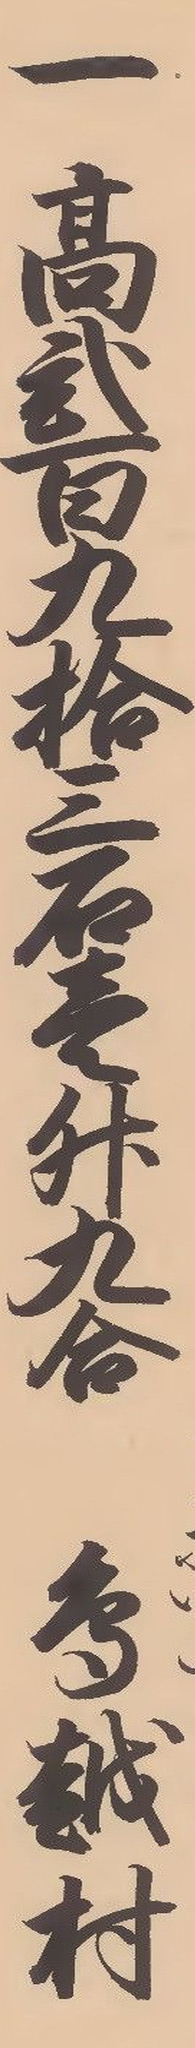一高弐百九拾三石壱升九合鳥越村
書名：石見国郷帳
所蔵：国立公文書館 National Archives of Japan
